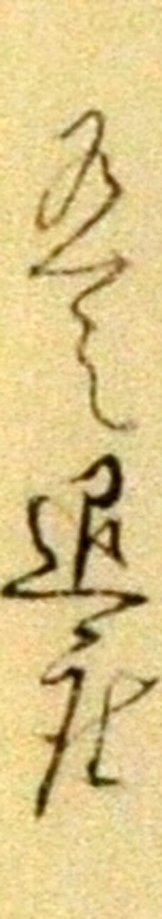有之退座

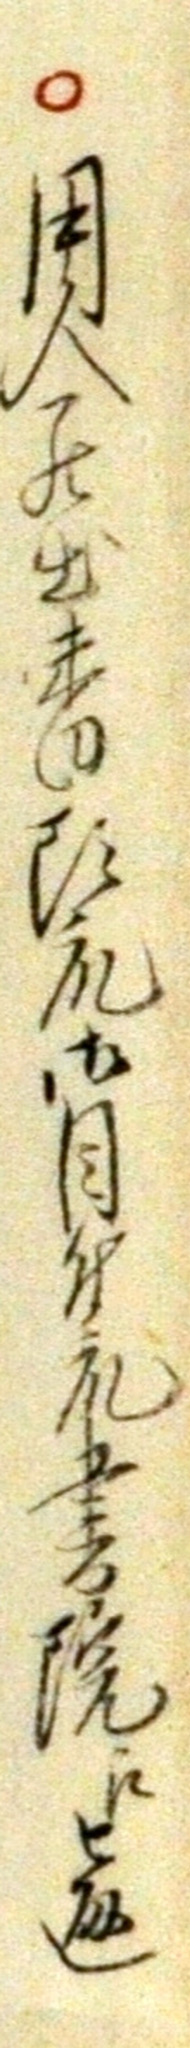用人罷出番頭衆御目付衆書院江え被通
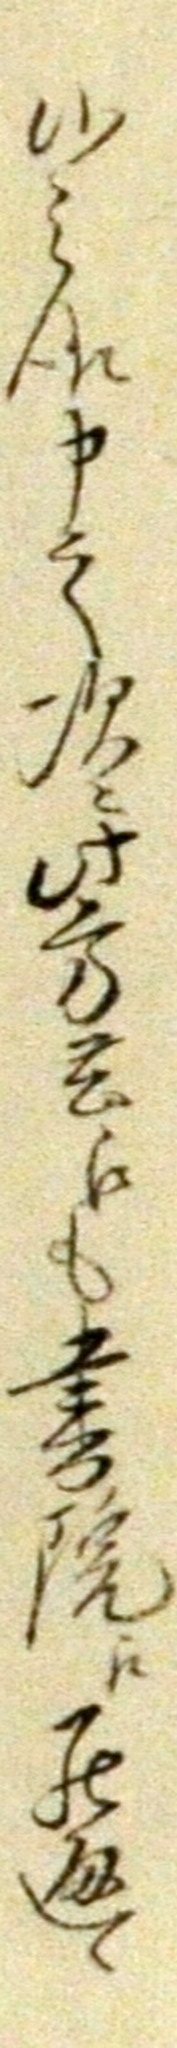候之様申て次ニ此方共えも書院え罷通候
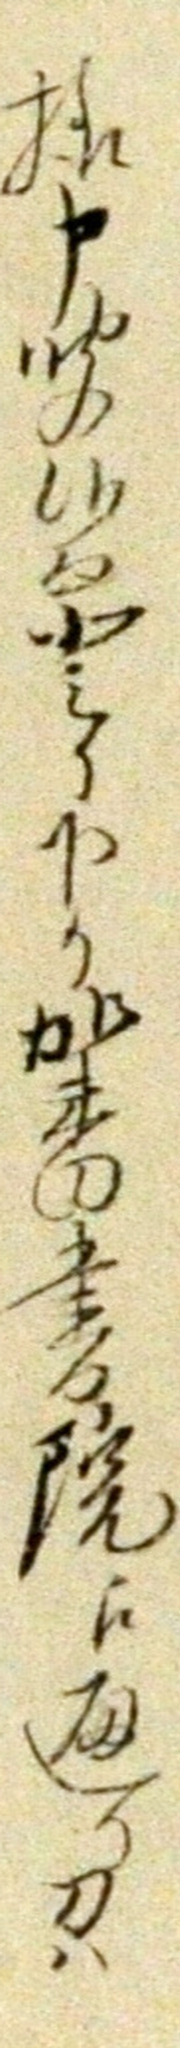様申聞候而登り下り加番書院え通り刀ハ
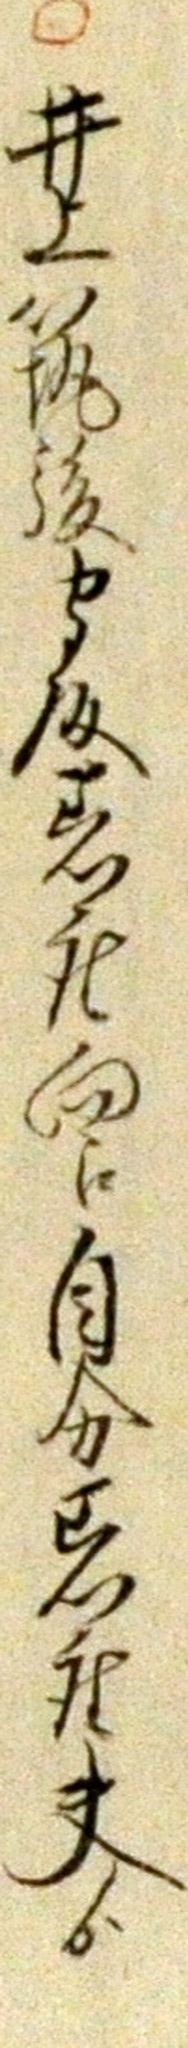井上筑後守殿着座向え自分着座夫ゟ
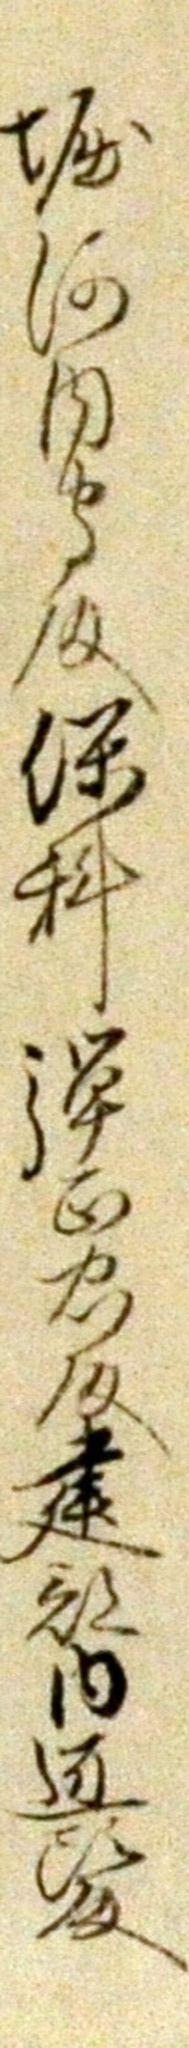堀河内守殿保科弾正忠殿建部内匠頭殿
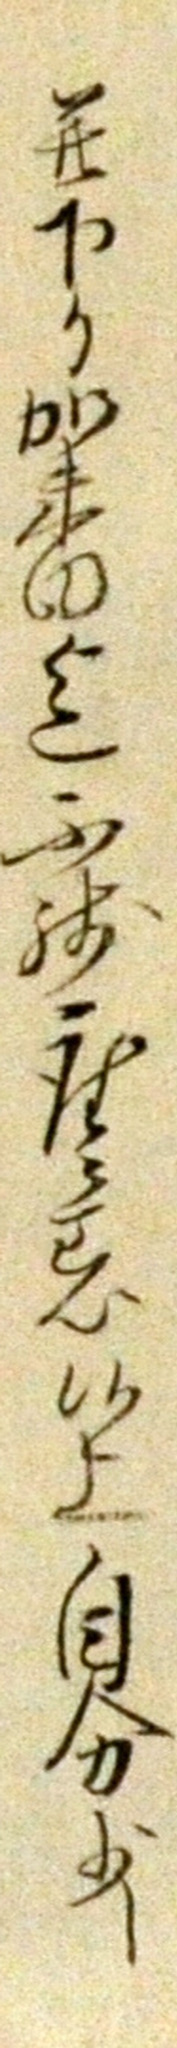并下り加番迄不残座ニ着候上自分少し
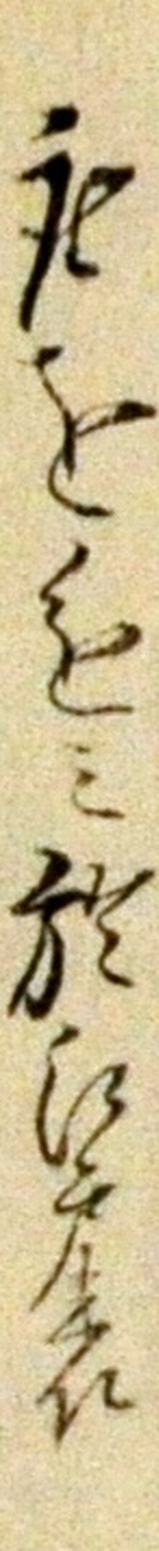座を進ミ於江戸表
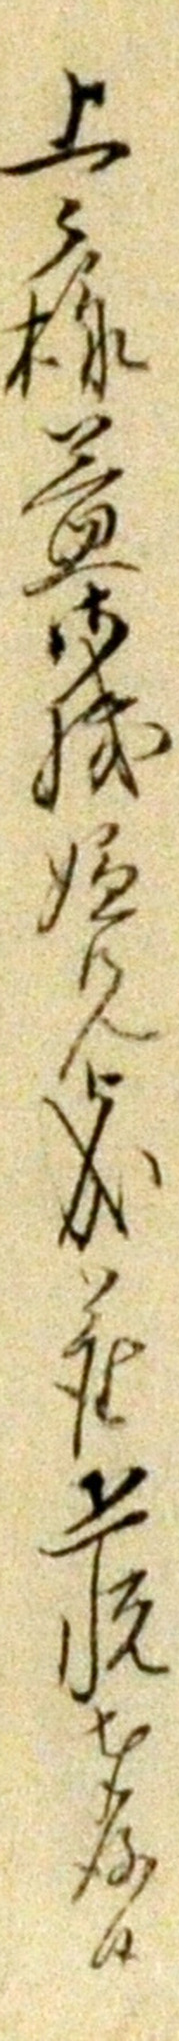上々様益御機嫌克被成御座恐悦奉存候
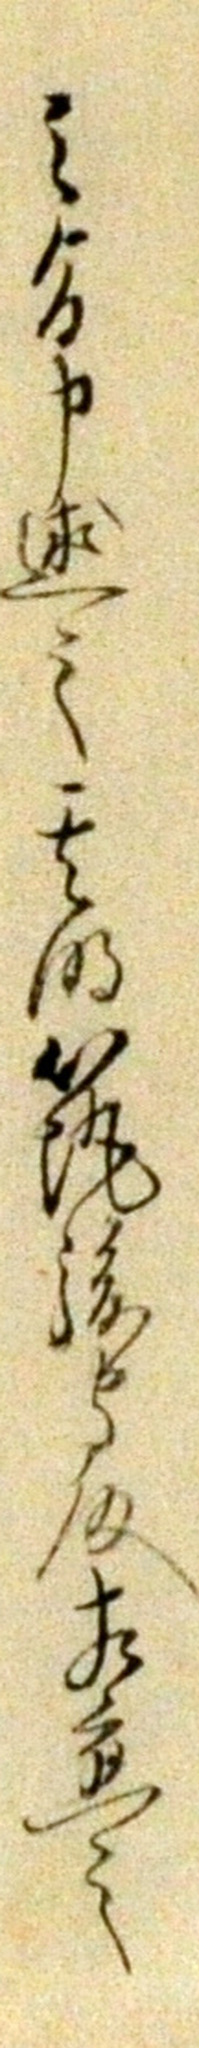之旨申述之其時筑後守殿相応之
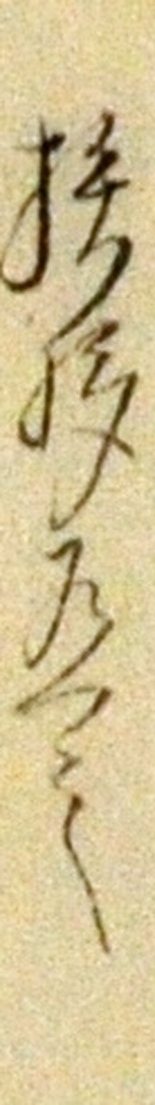挨拶有之
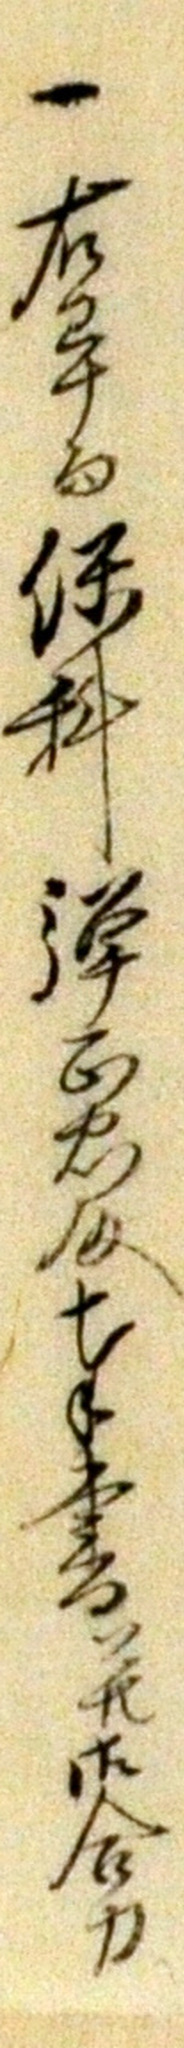一右畢而保科弾正忠殿奉書并御合力
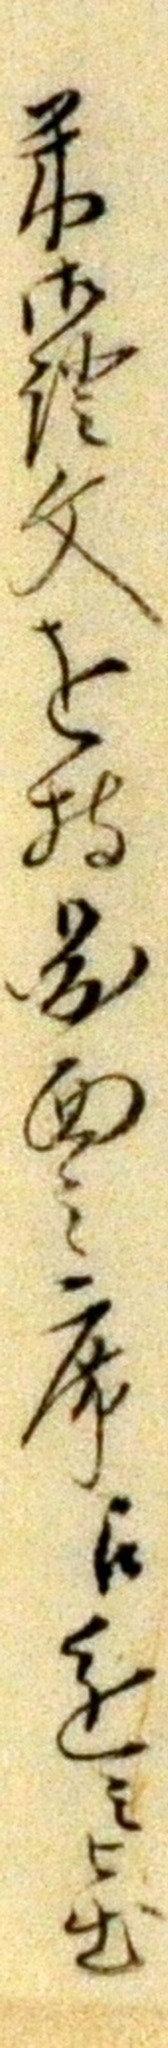米御證文を持図面之席え進ミ被出
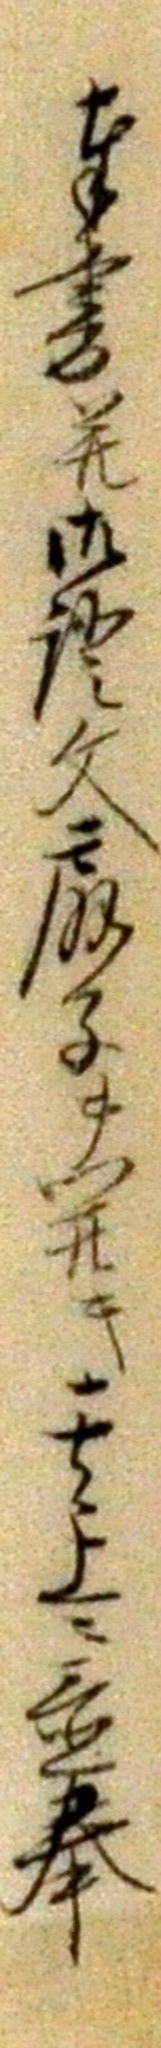奉書并御證文扇子ヲ開キ其上ニ置奉
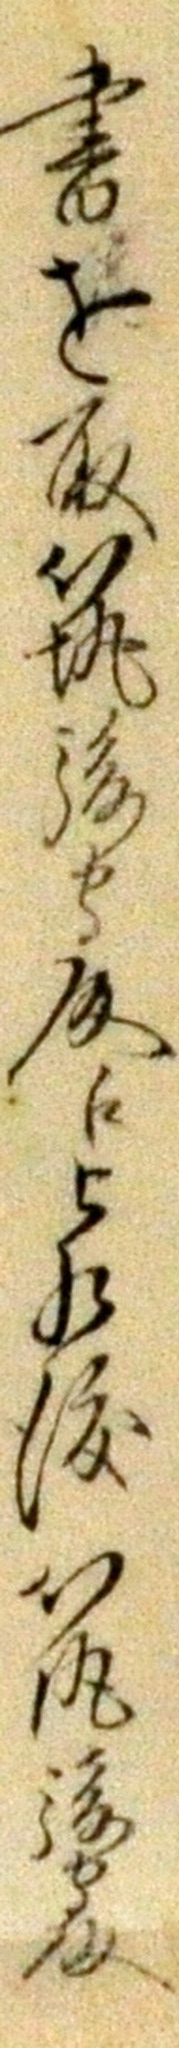書を取筑後守殿え被相渡筑後守殿
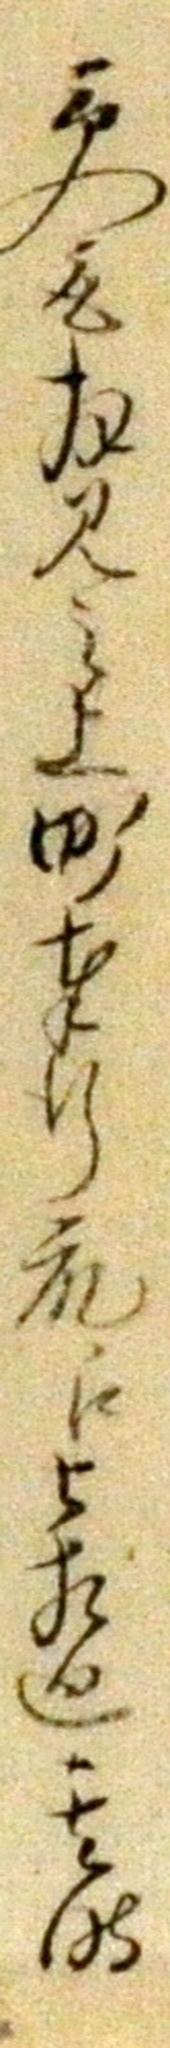受取拝見之上町奉行衆え被相廻其時
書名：大阪加番関係諸書留〔一括〕
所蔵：伊那市立高遠町図書館・合同会社AMANE
